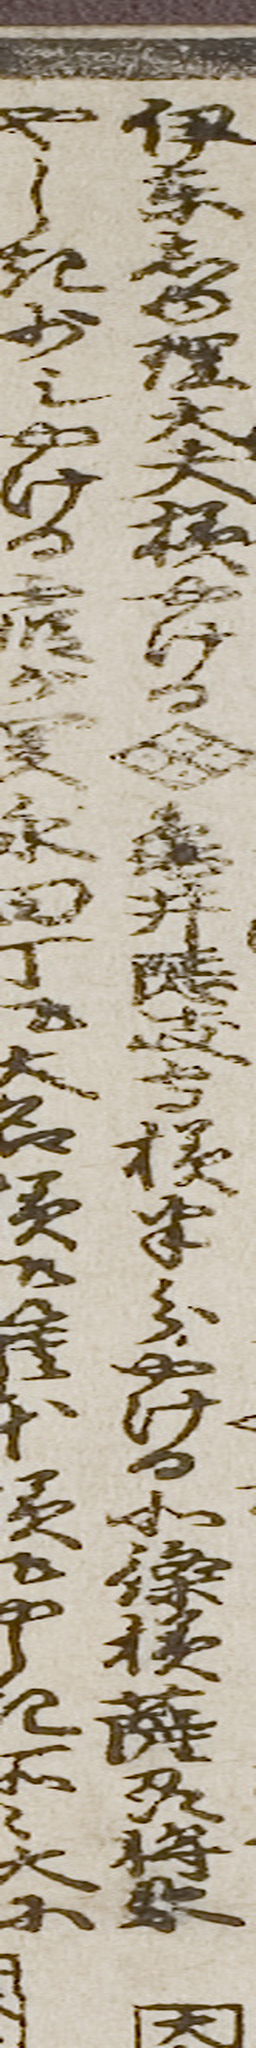やしき少しやける霞が関永田丁御大名様御旗本様御やしき所々大に
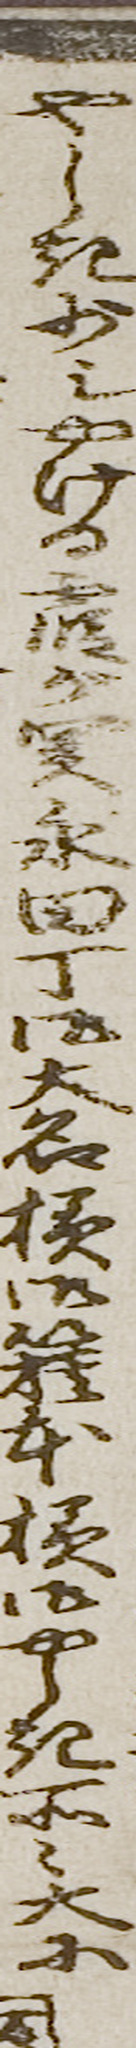やしき少しやける霞が関永田丁御大名様御旗本様御やしき所々大に
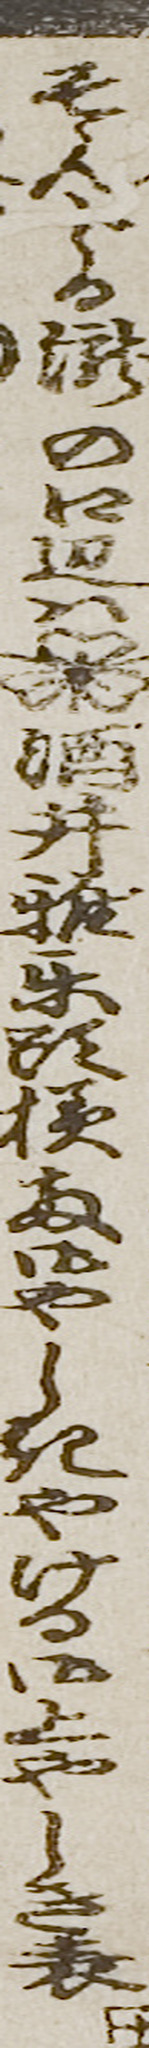そんじる瀧の口辺は〇酒井雅楽頭様両御やしきやける御上やしき表
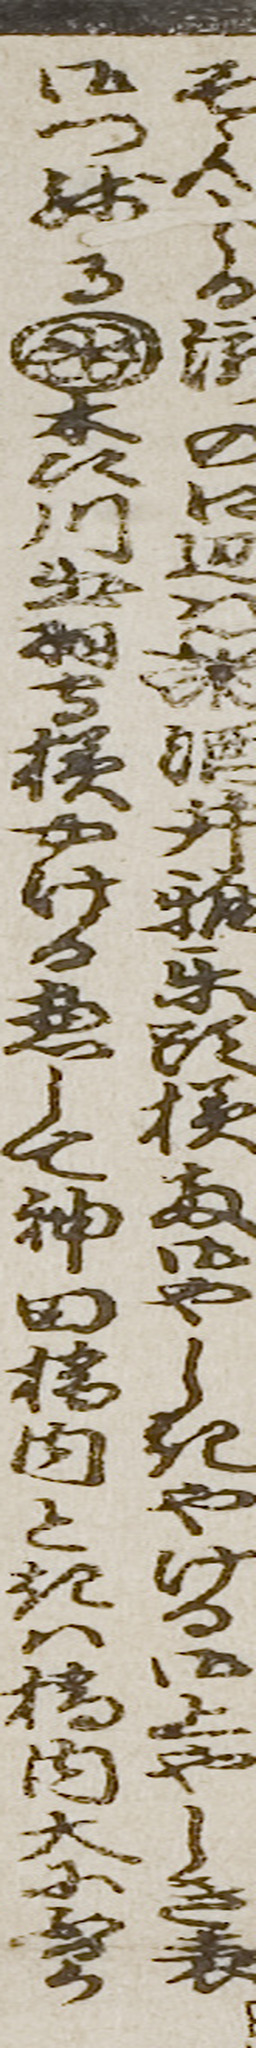御門残る〇森川出羽守様やける惣して神田橋内ときは橋内大にふるう
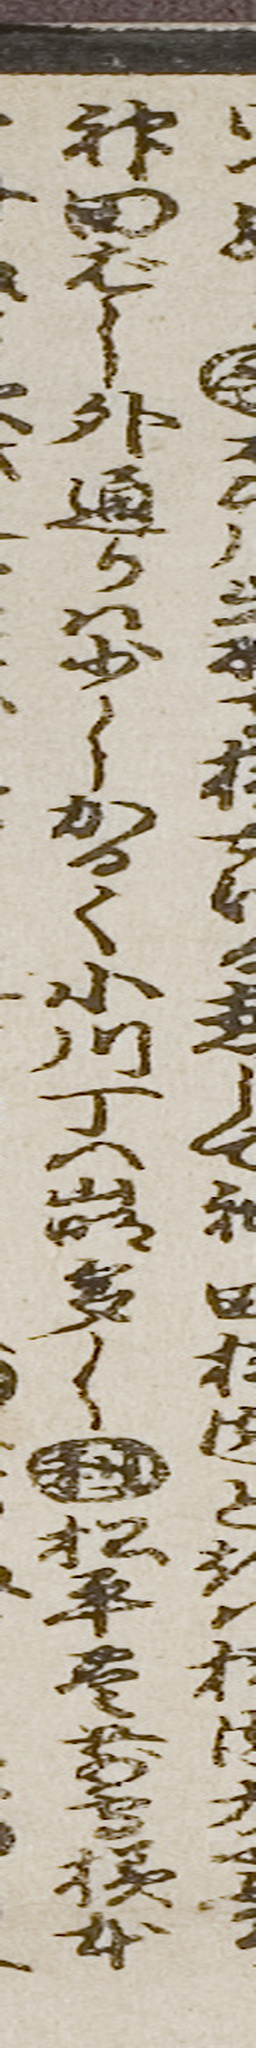神田ばし外通りは少しかるく小川丁は崩多し〇松平豊前守様本
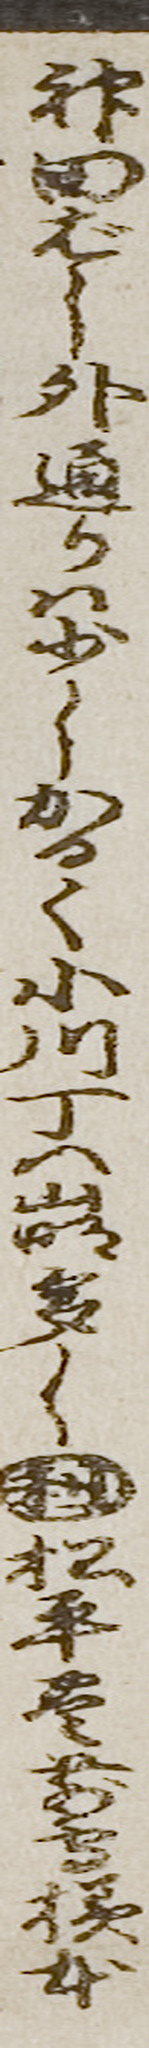神田ばし外通りは少しかるく小川丁は崩多し〇松平豊前守様本
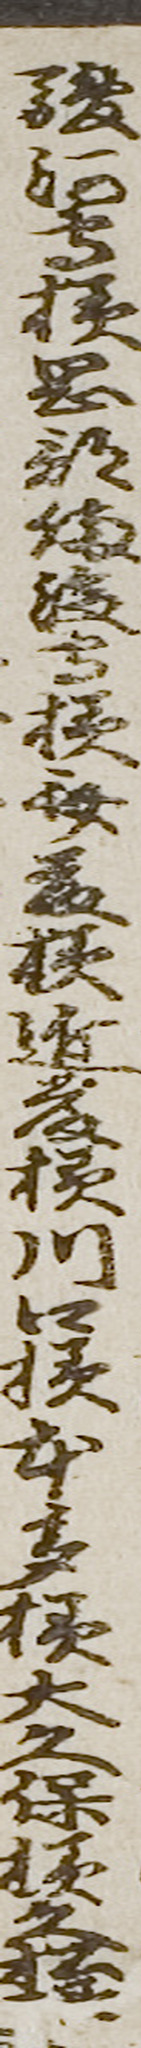駿河守様岡部備後守様斎藤様近藤様川口様本多様大久保様久松様
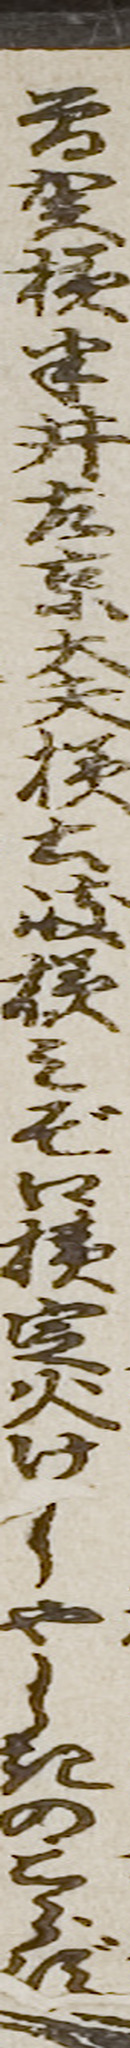曽賀様半井左京大夫様土岐様みぞ口様定火けしやしきのこらず
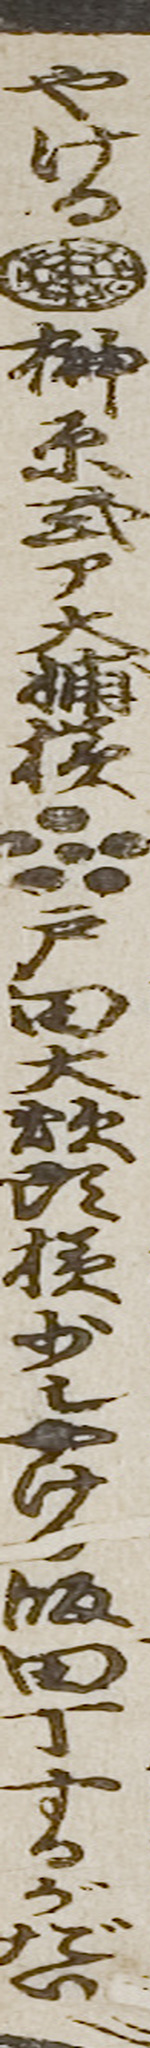やける〇榊原式部大輔様〇戸田大炊頭様少しやける飯田丁するがだい
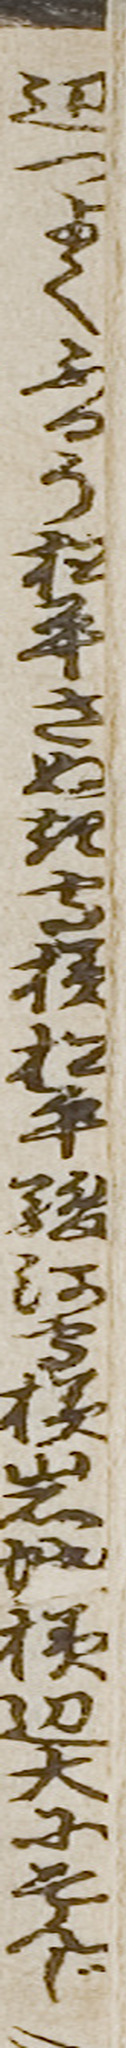辺つよくふるう松平さぬき守様松平駿河守様岩城様辺大にそんじ
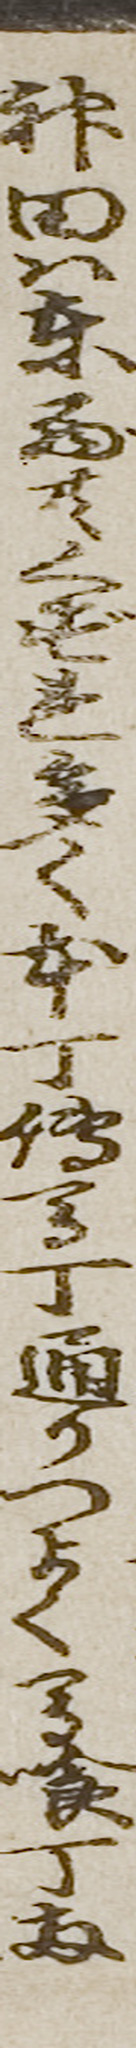神田は東西共くずれ多く本丁伝馬丁通りつよく馬喰丁両
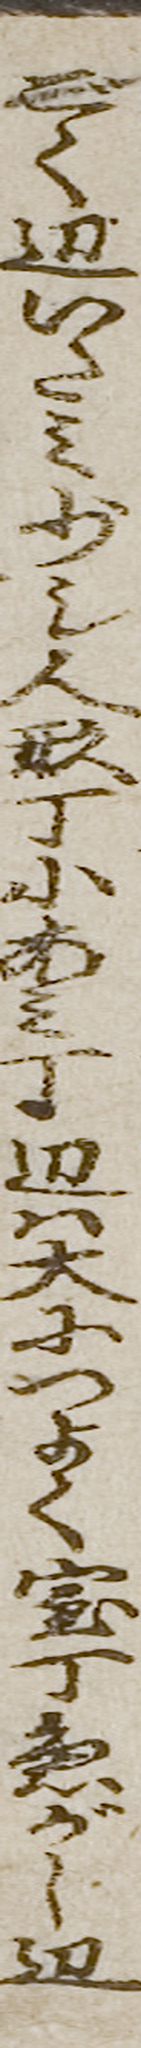ごく辺いたみ少シ人形丁小あみ丁辺は大につよく宝丁魚がし辺
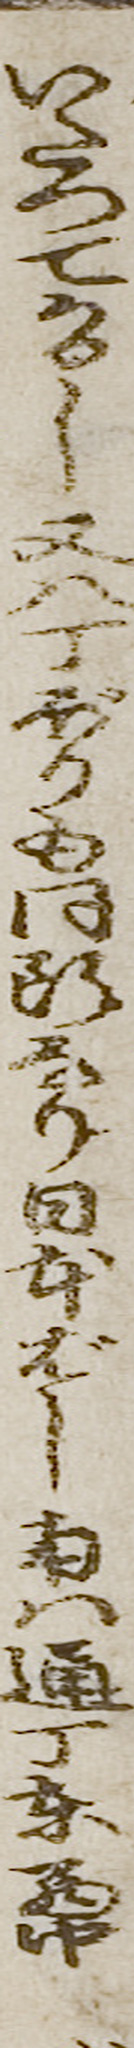いたつてかるし又八丁ぼりも同断なり日本ばし南は通丁東西中
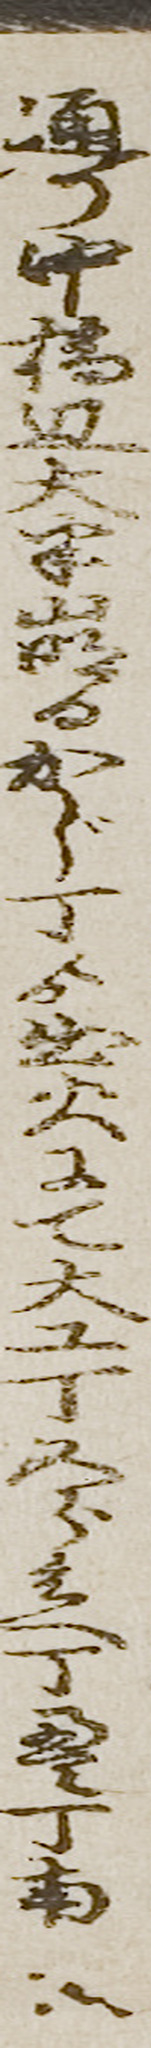通り中橋辺大半崩るかじ丁ゟ出火にて大工丁五郎兵へ丁畳丁南
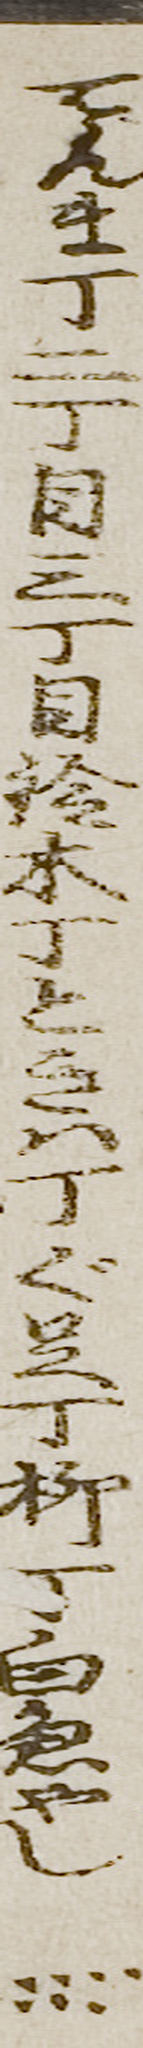てんま丁二丁目三丁目鈴木丁ときは丁ぐ足丁柳丁白魚やし
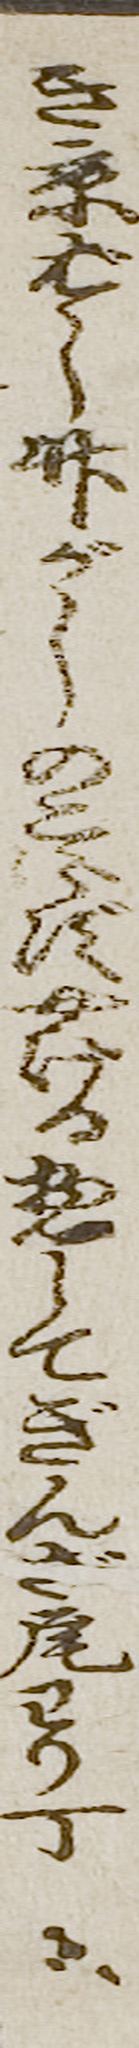き京ばし竹がしのこらずやける惣してぎんざ尾わり丁
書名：安政改正泰平盤石図会
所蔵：東京大学総合図書館 General Library in the University of Tokyo, JAPAN
